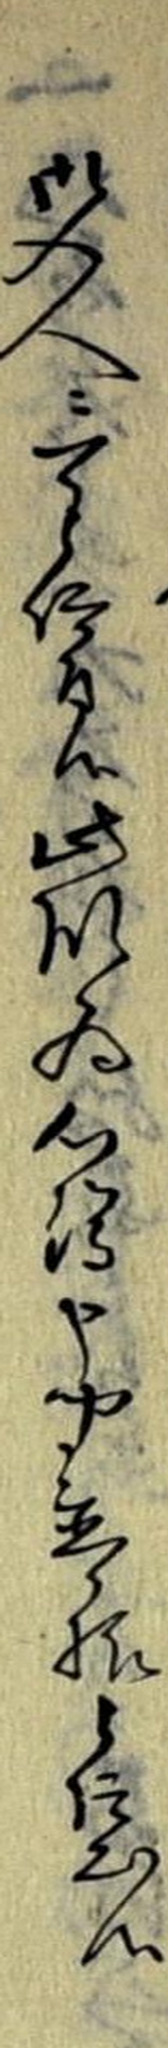御入人に可被仰付候此段為心得申聞置候様被仰出候
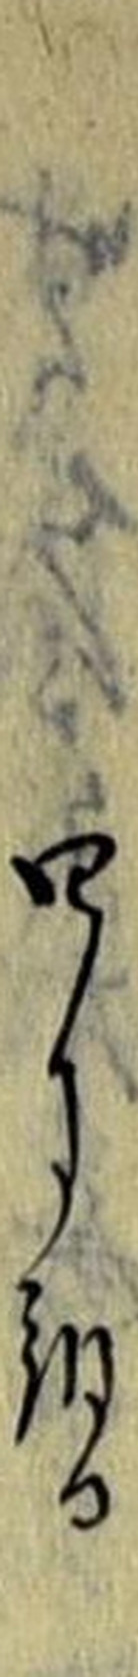四月朔日
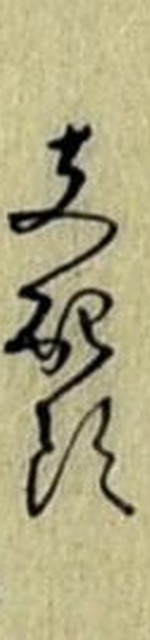支配頭
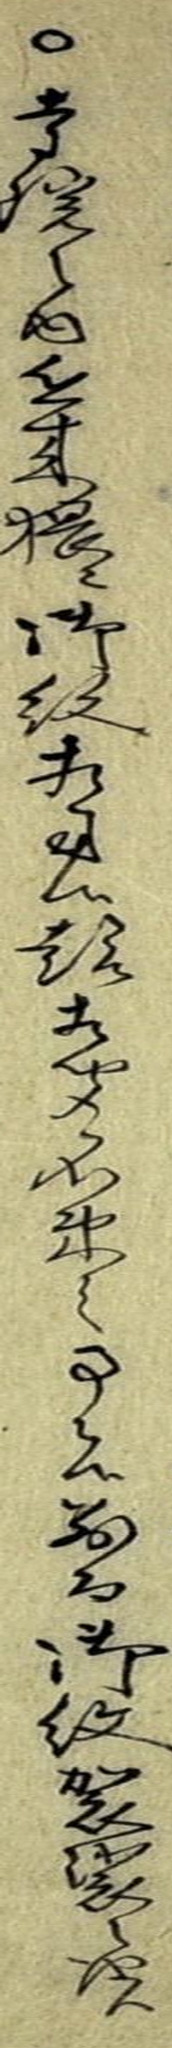○寺院之内近来猥に御紋相用候趣相聞不束之事に候別而御紋袈裟之儀は
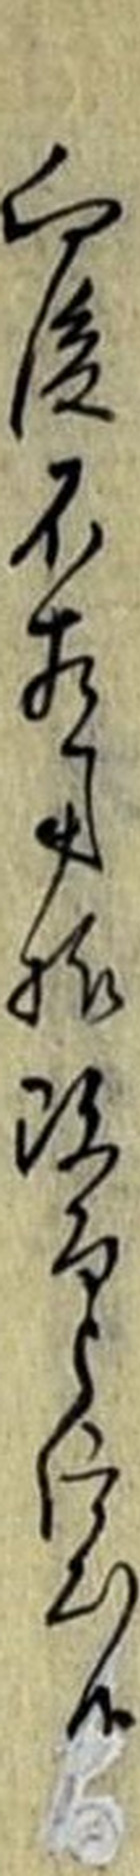向後不相用様改而被仰出候
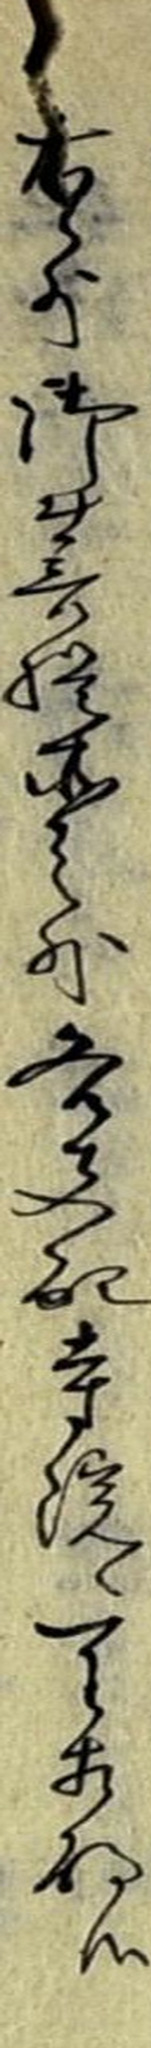右之外御菩提所之外各支配寺院へ可被相触候
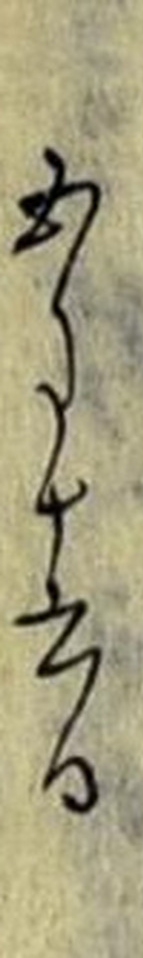五月十六日
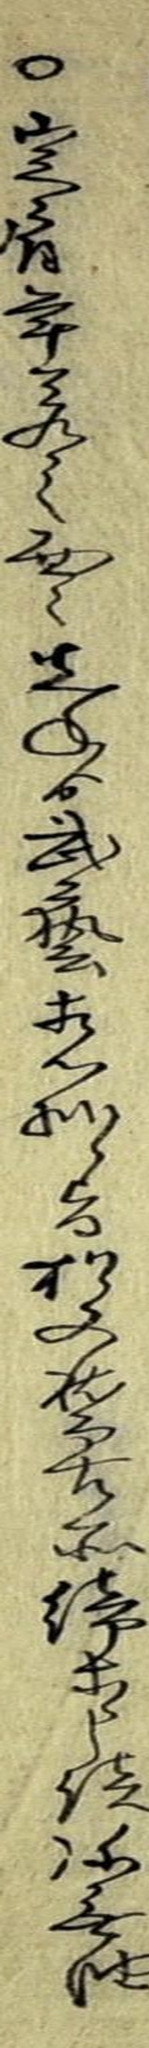○定府年若之面々先年ゟ武芸相心掛候旨猶又稽古所締等申談弥無由
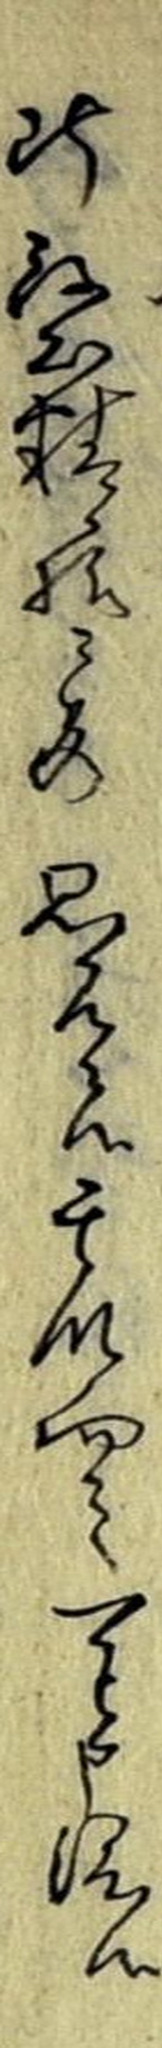断致出精候様にとの思召に候其段向々へ可被申渡候
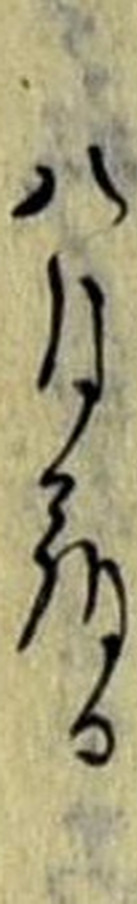八月朔日

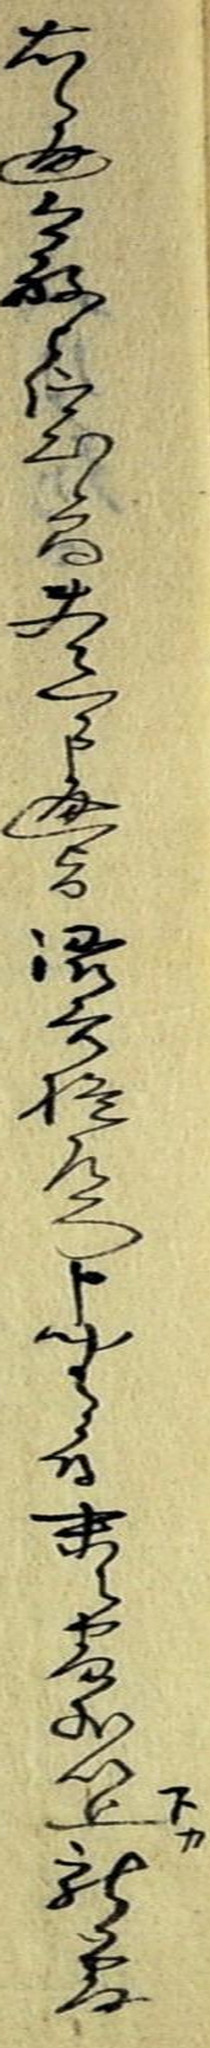右之通今般被仰出候間夫々可申通旨渋谷権左衛門申聞き候に付末之番外以上新御番
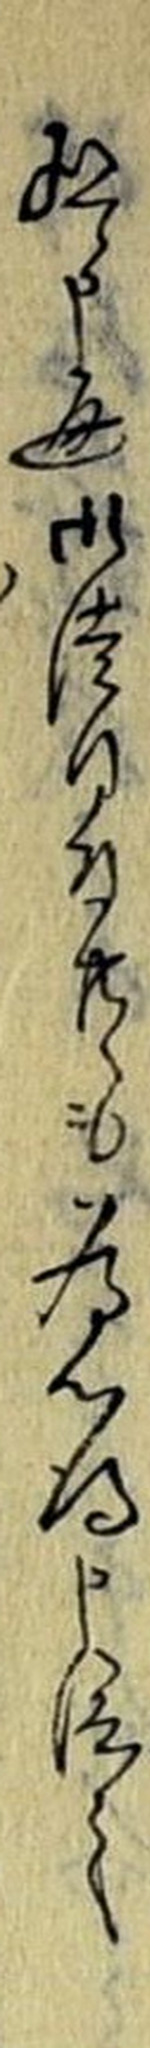組へ申通御徒目付共へも為心得申渡之
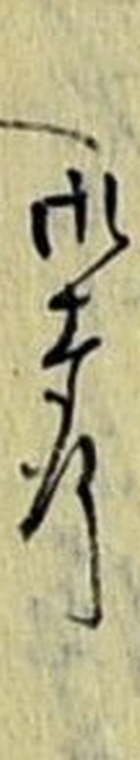御奉行
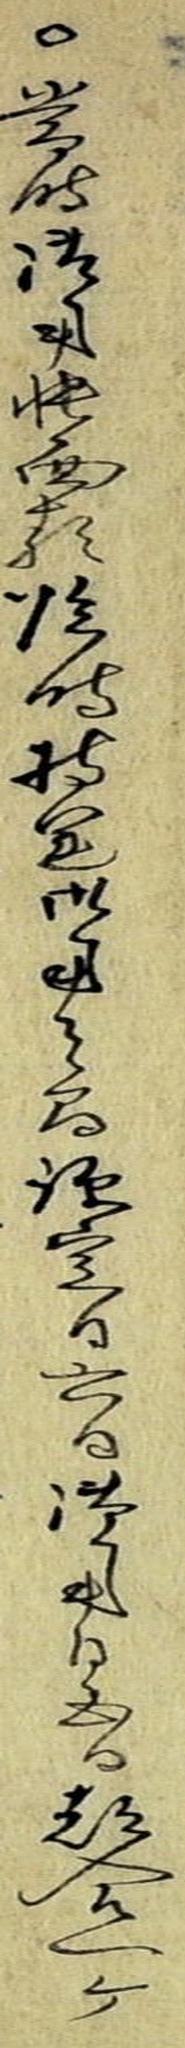○当時御用帳面類臨時持運御用に候間評定日六日御用日五日都合一ヶ
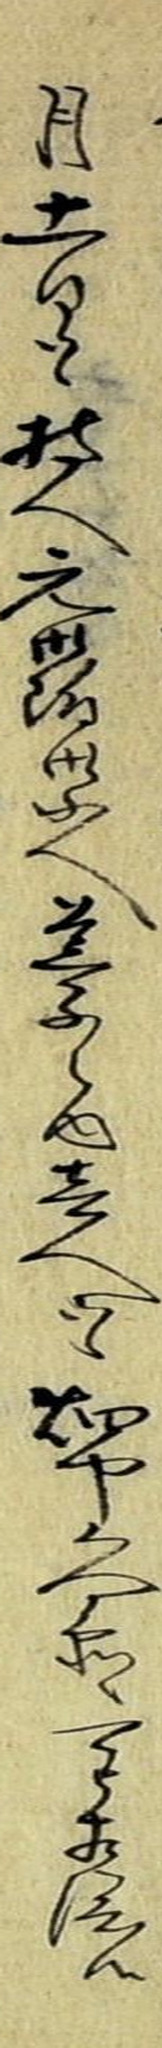月十一日つヽ持人元御附御小人荒子之内壱人つゝ畑中久兵衛へ可被相渡候
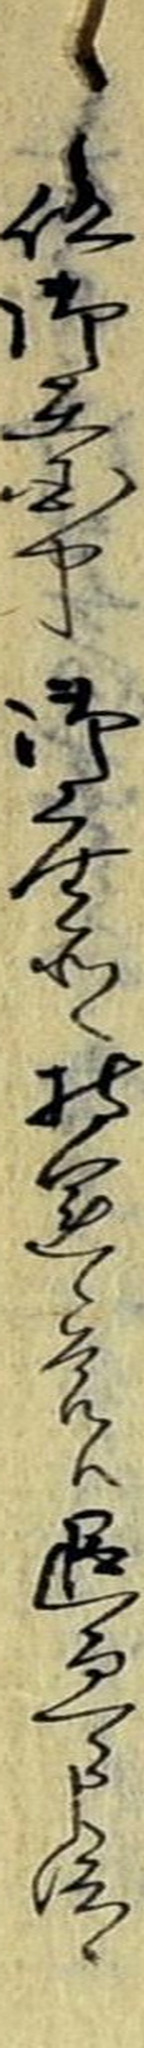但御在国中御座所へ持運候節は追而可申渡候
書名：命令之部 四
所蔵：福井県文書館 Fukui Prefectural Archives
